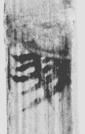𦘔
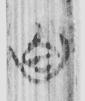自
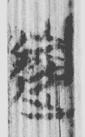{止達}
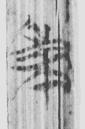秉
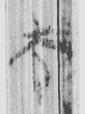夫
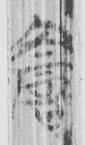{产言}
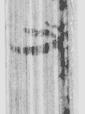又
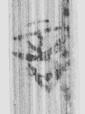言
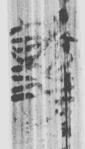漸=
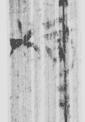柯=
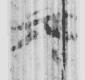亓
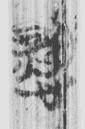{則心}
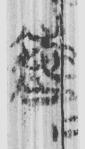遠=
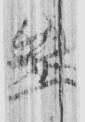監
